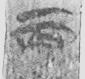百
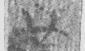廿
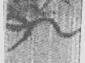九
